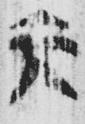亓（其）
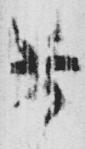先
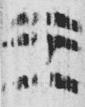王
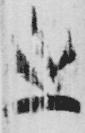之
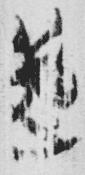道
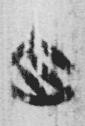自
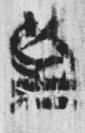爲
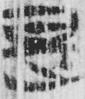是
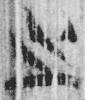之
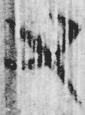又
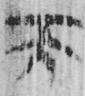天
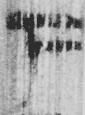下
